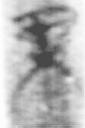果（戈）
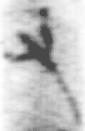又（有）
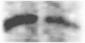一
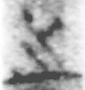之
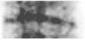一
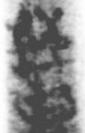晉
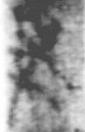杸
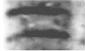二
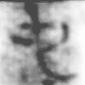屯
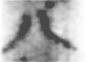八
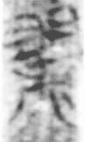翼
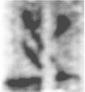之
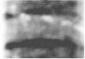二
